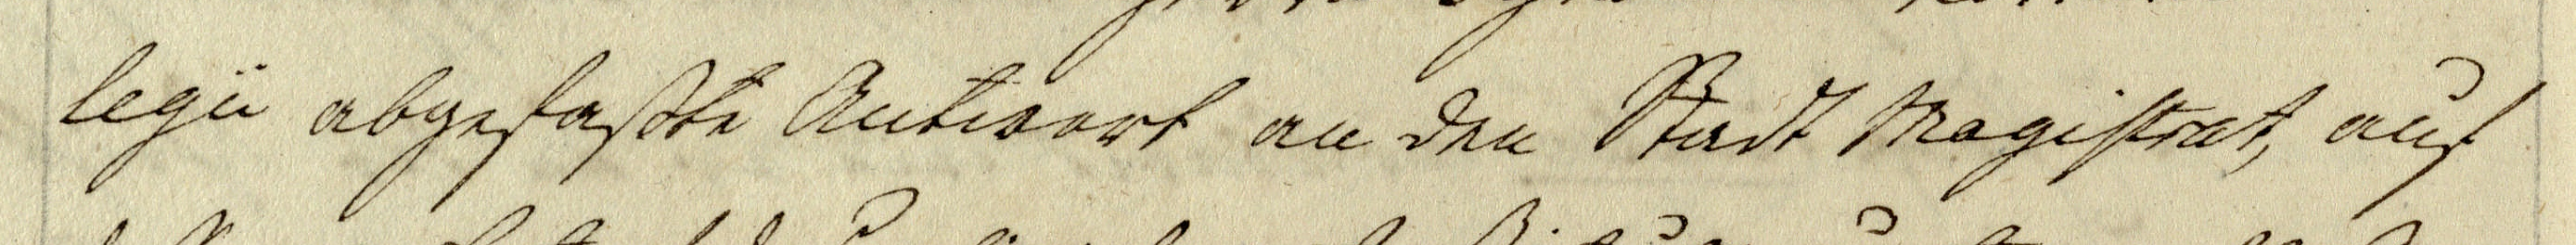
legii abgefaßte Antwort an den Stadt Magistrat, auf
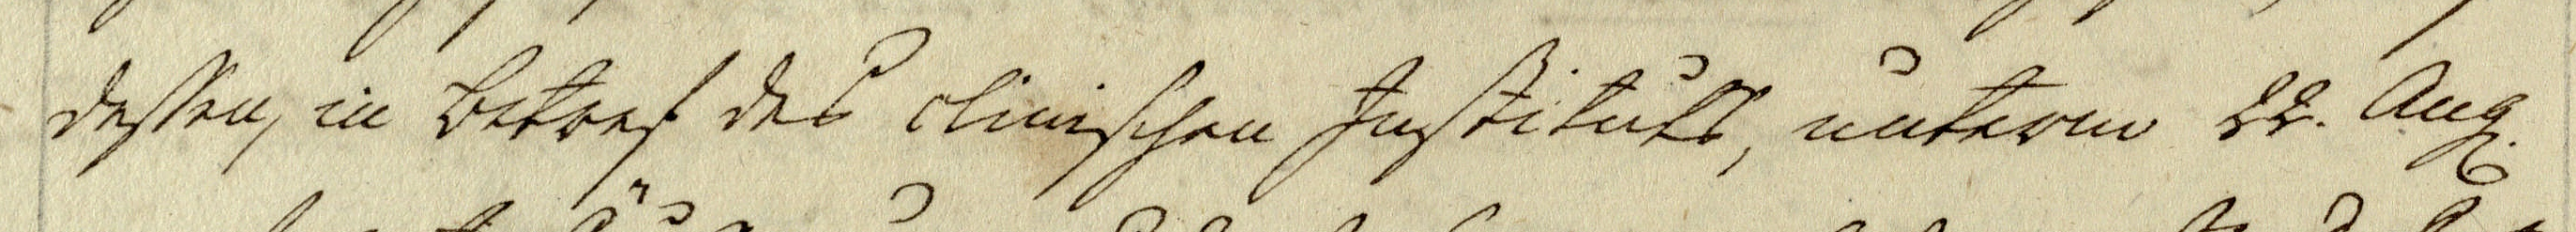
dessen, in Betref des clinischen Instituts, unterm 22. Aug.
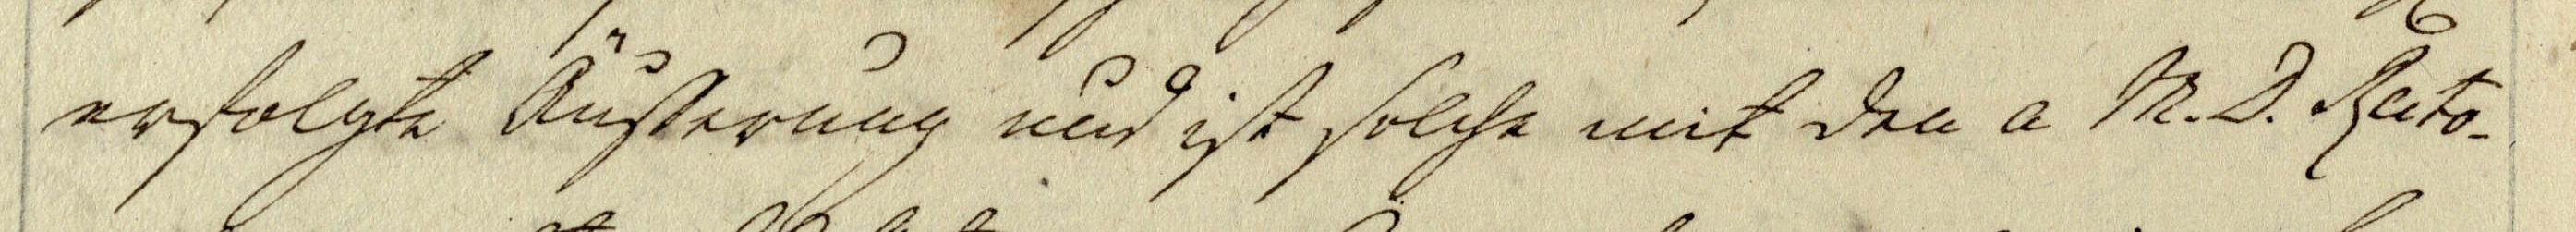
erfolgte Äusserung und ist solche mit den a M. D. Recto¬
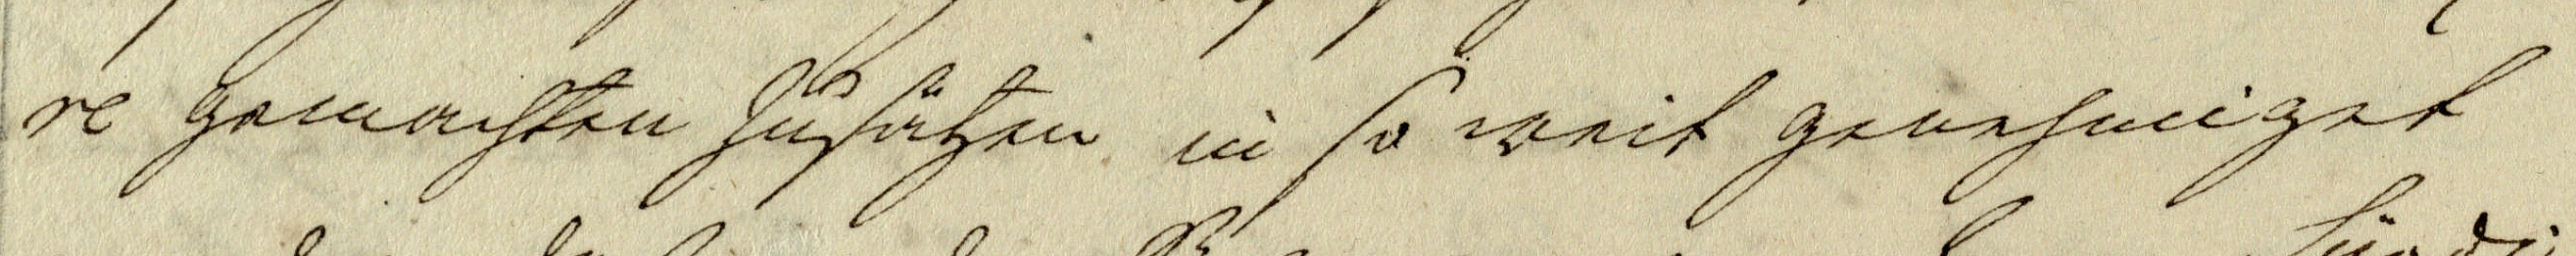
re gemachten Zusätzen in so weit genehmiget
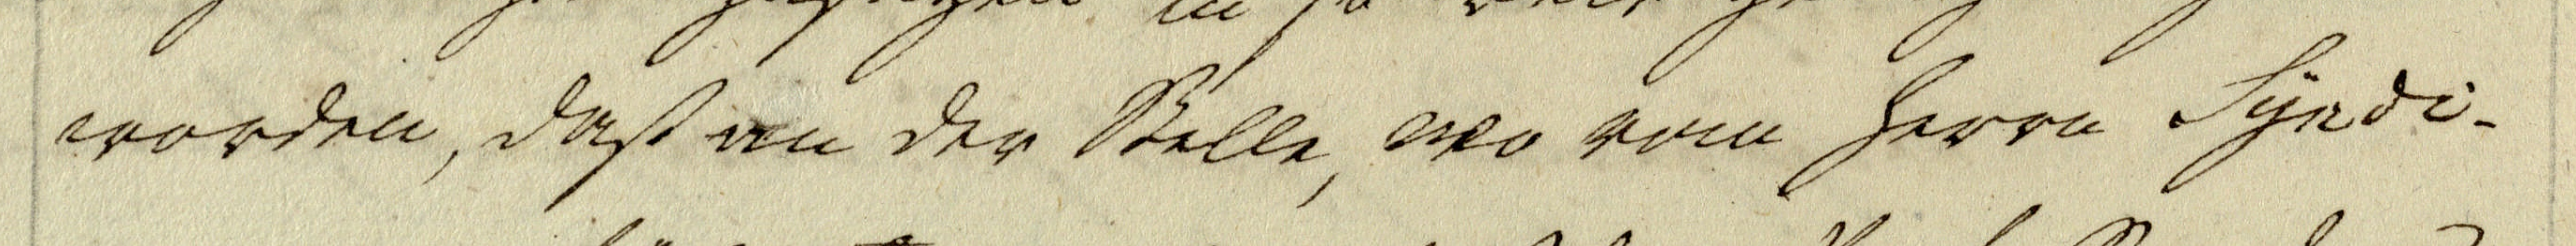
worden, daß an der Stelle, wo vom Herrn Sÿndi¬
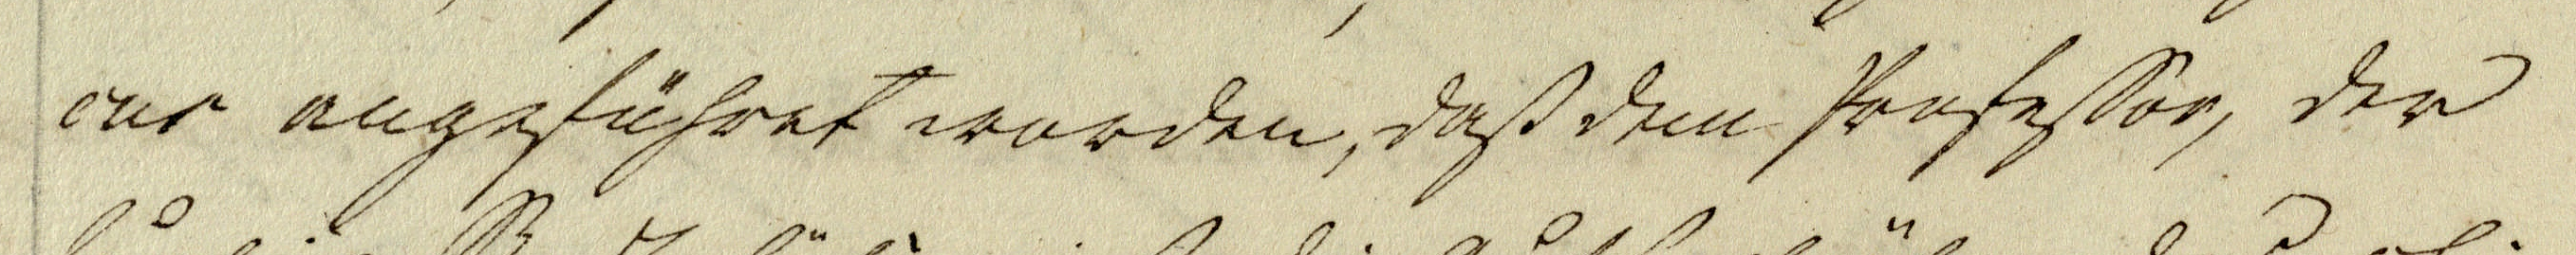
cus angeführet worden, daß dem Professor, der
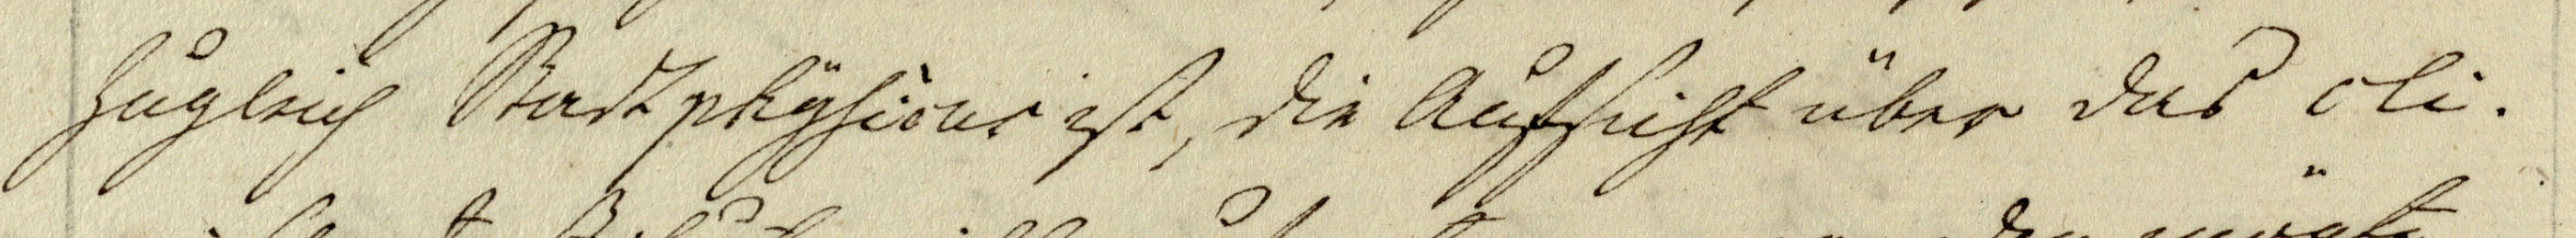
zugleich Stadtphÿsicus ist, die Aufsicht über das cli¬
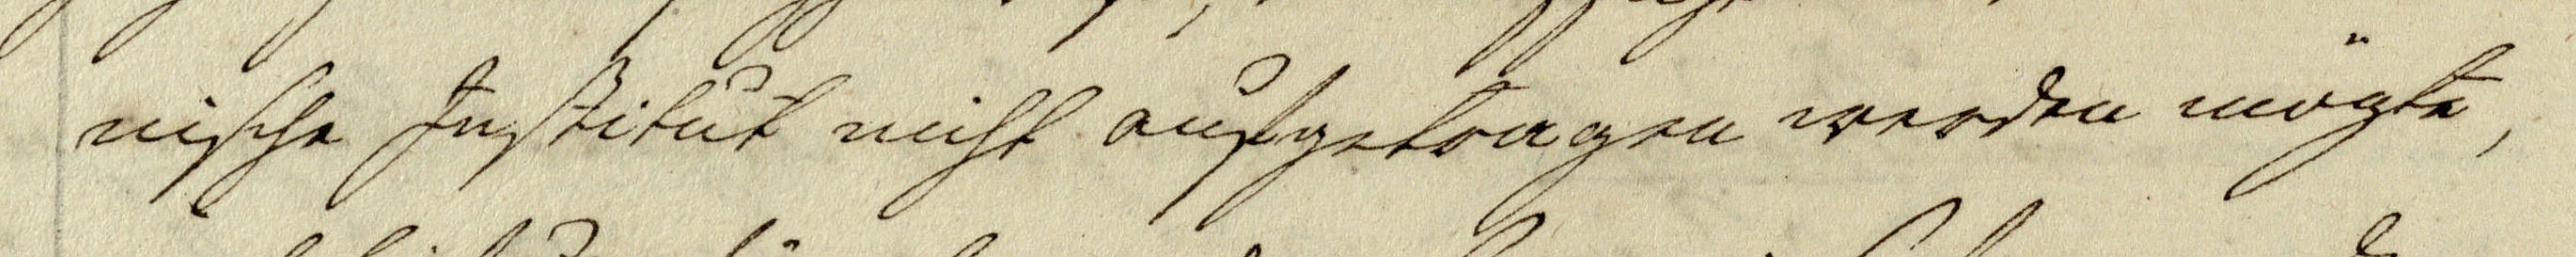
nische Institut nicht aufgetragen werden mögte,
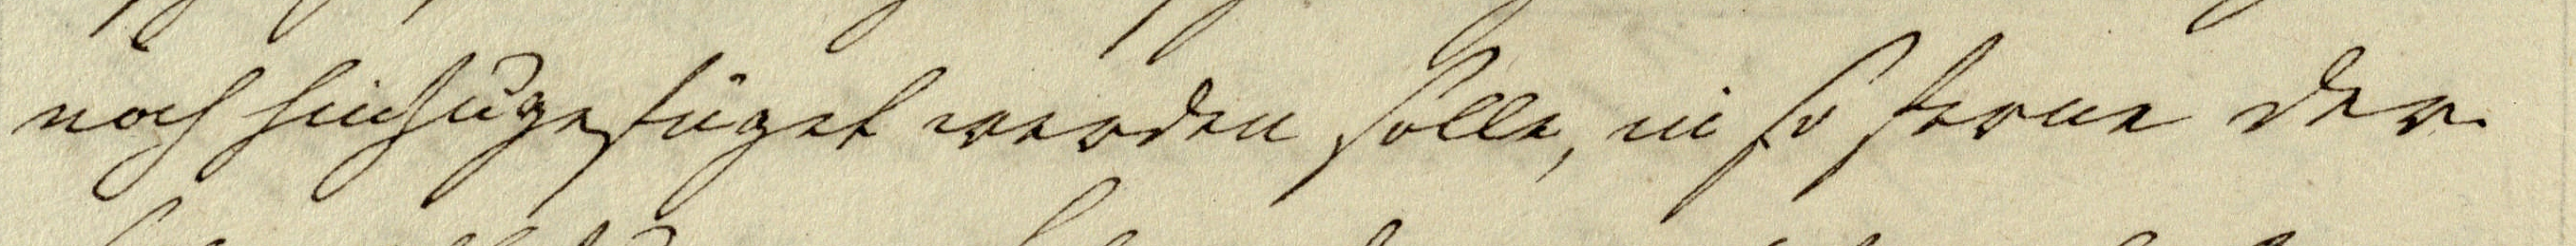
noch hinzugefüget werden solle, in so ferne der¬
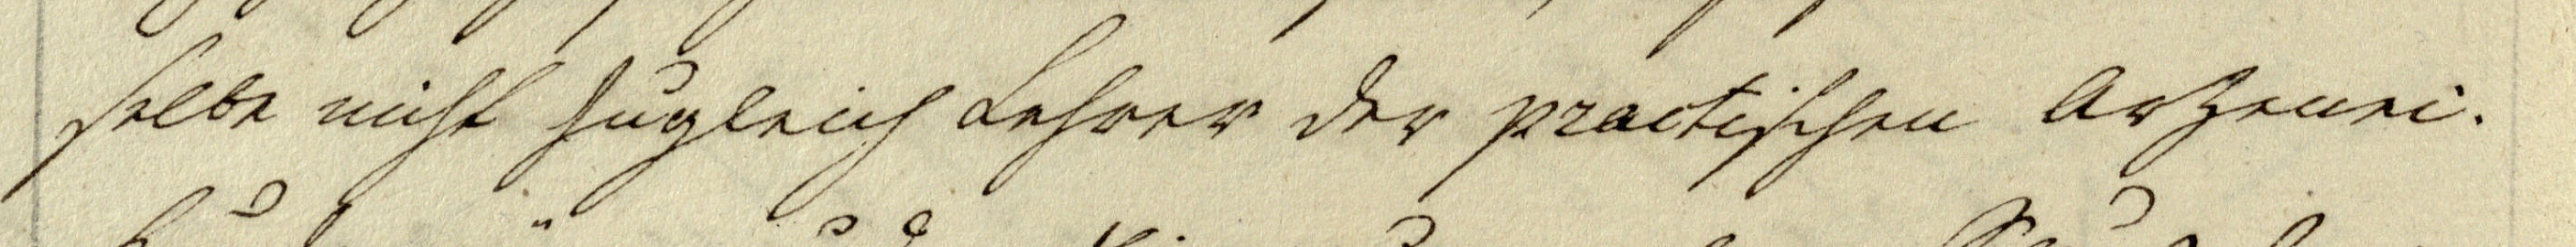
selbe nicht zugleich Lehrer der practischen Arzenei¬
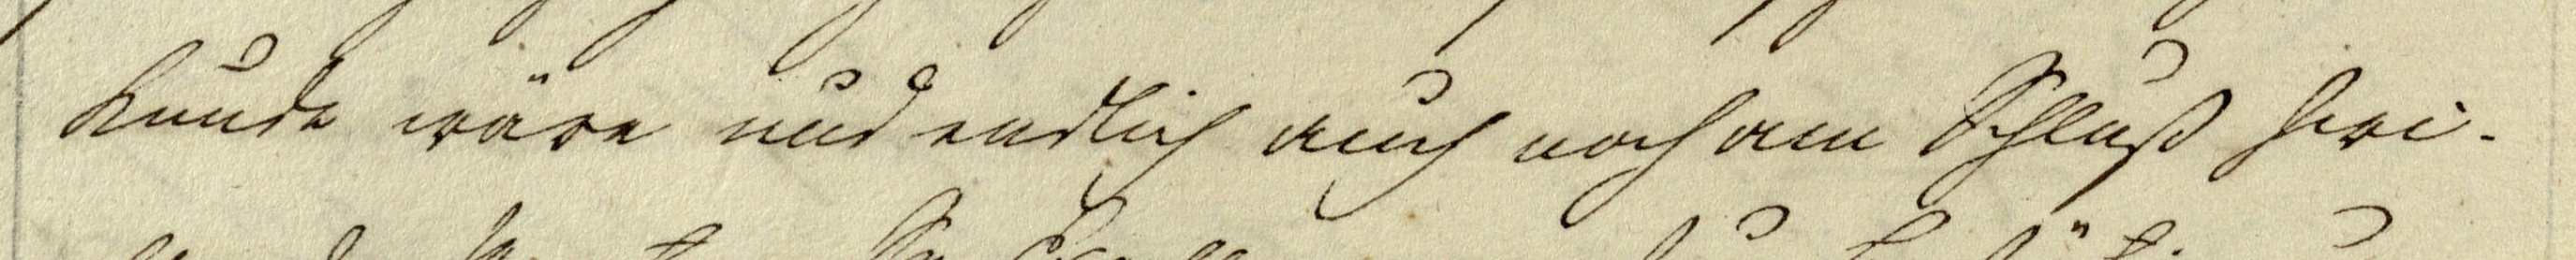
kunde wäre und endlich auch noch am Schluß zwi¬
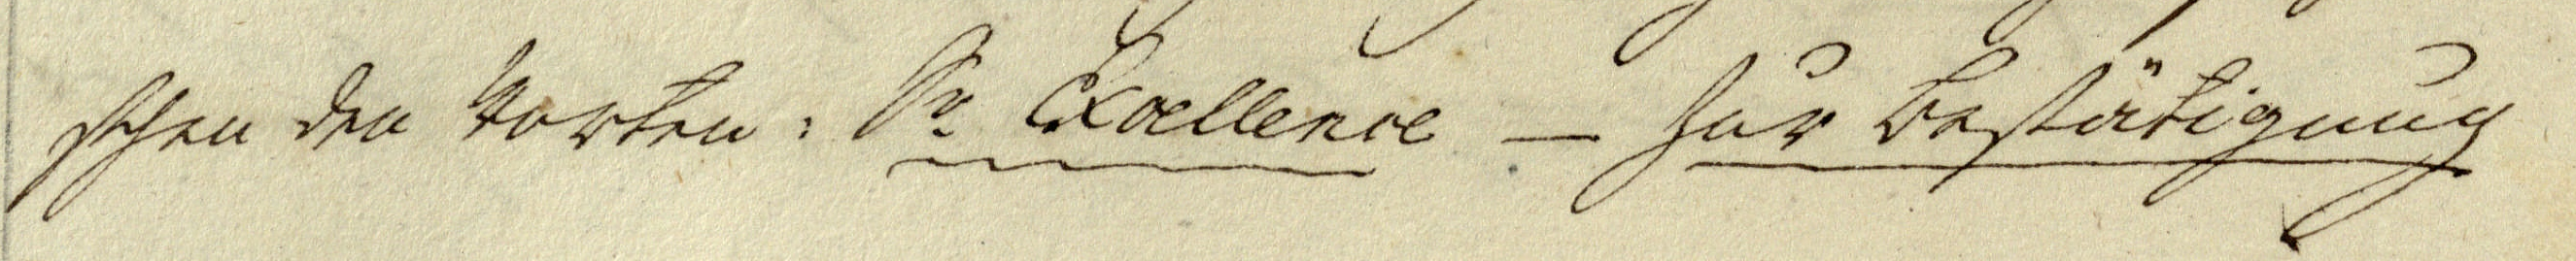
schen den Worten: Sr Excellence zur Bestätigung
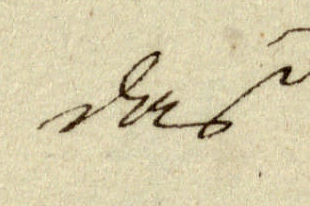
das
